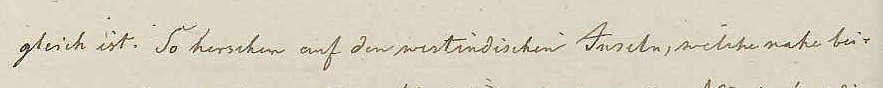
gleich ist. So herschen auf den westindischen Inseln, welche nahe bei-
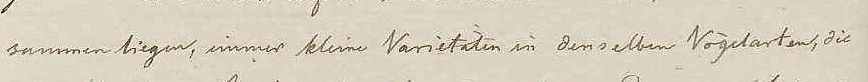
sammen liegen, immer kleine Varietäten in denselben Vögelarten, die
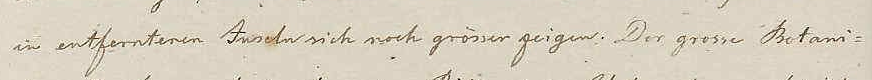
in entfernteren Inseln sich noch grösser zeigen. Der grosse Botani-
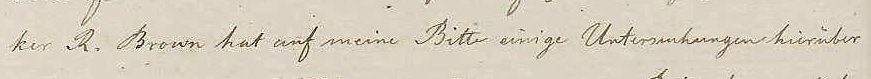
ker R. Brown hat auf meine Bitte einige Untersuchungen hierüber
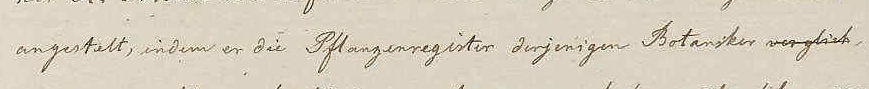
angestelt, indem er die Pflanzenregister derjenigen Botaniker verglich,
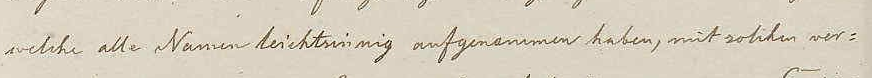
welche alle Namen leichtsinnig aufgenommen haben, mit solchen ver-
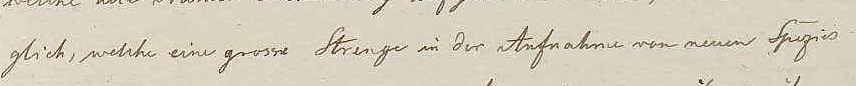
glich, welche eine grosse Strenge in der Aufnahme von neuen Spezies
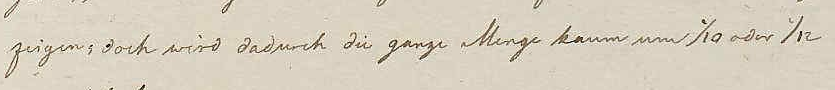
zeigen; doch wird dadurch die ganze Menge kaum um ⅒ oder 1
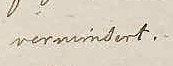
vermindert.
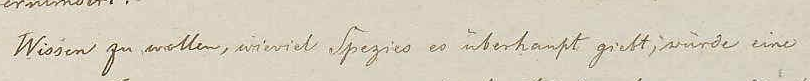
Wissen zu wollen, wieviel Spezies es überhaupt giebt, würde eine
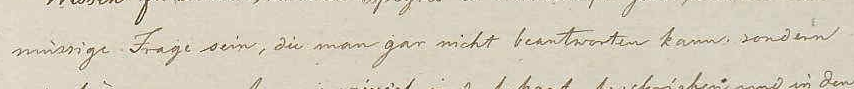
müssige Frage sein, die man gar nicht beantworten kann, sondern
